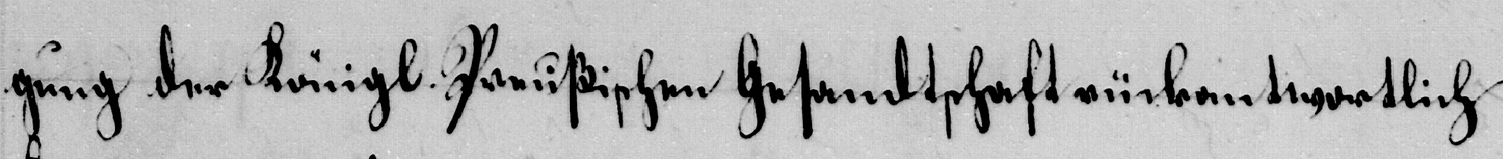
gung der Königl: Preußischen Gesandtschaft rückantwortlich
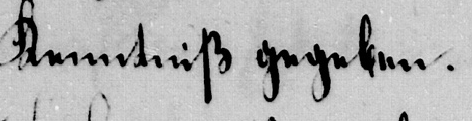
Kenntniß gegeben.
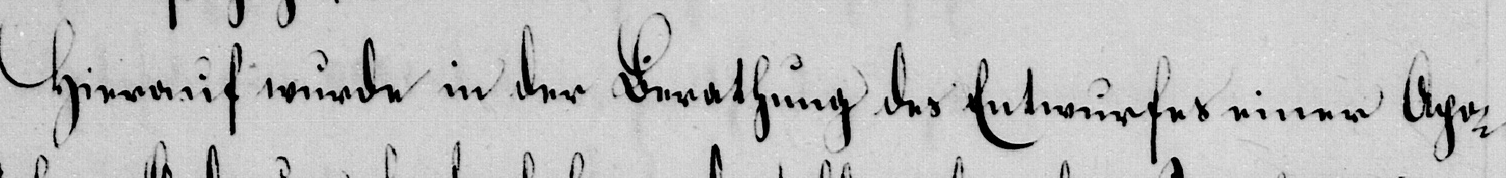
Hierauf wurde in der Berathung des Entwurfes einer Apo¬
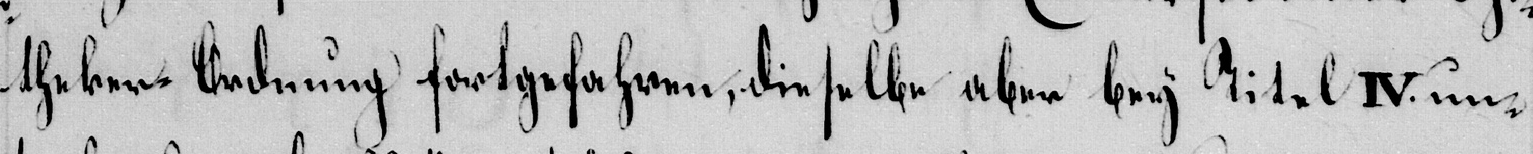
theker-Ordnung fortgefahren, dieselbe aber bey Titel IV. un¬
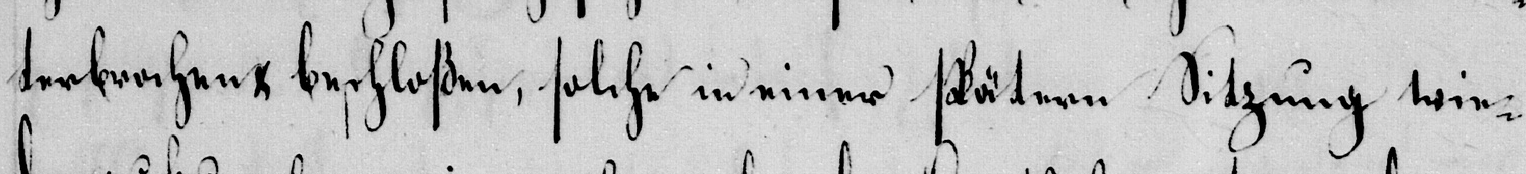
terbrochen &. beschloßen, solche in einer spätern Sitzung wie¬
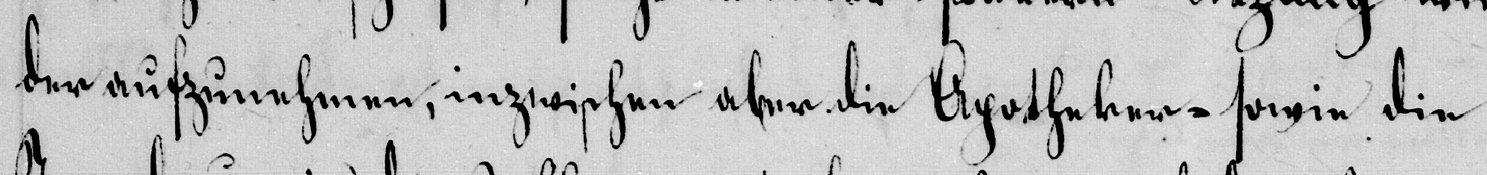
der aufzunehmen, inzwischen aber die Apotheker- sowie die
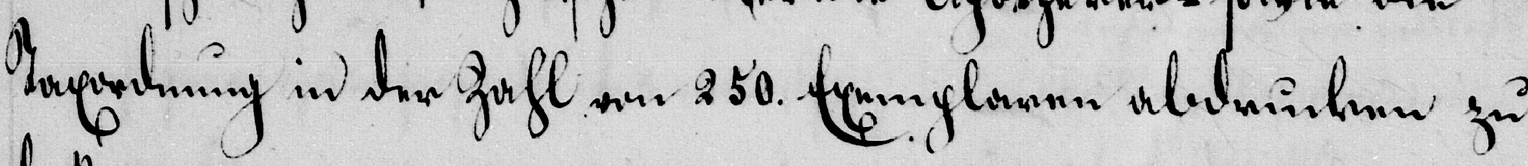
Taxordnung in der Zahl von 250. Exemplaren abdrucken zu
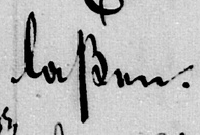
laßen.
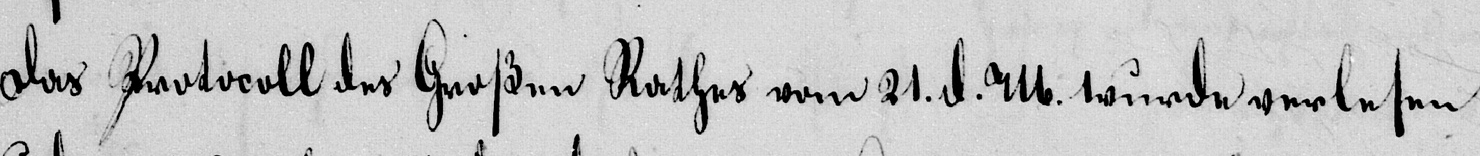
Das Protokoll des Großen Rathes vom 21. d. M. wurde verlesen
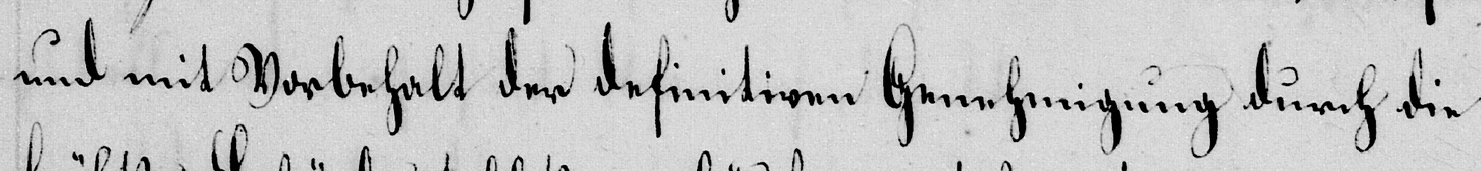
und mit Vorbehalt der definitiven Genehmigung durch die
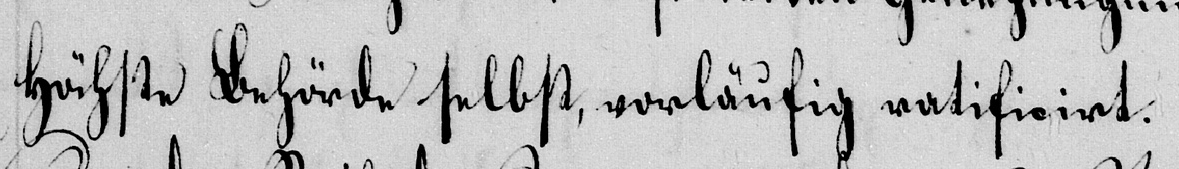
Höchste Behörde selbst, vorläufig ratificirt.
